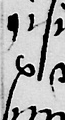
d.
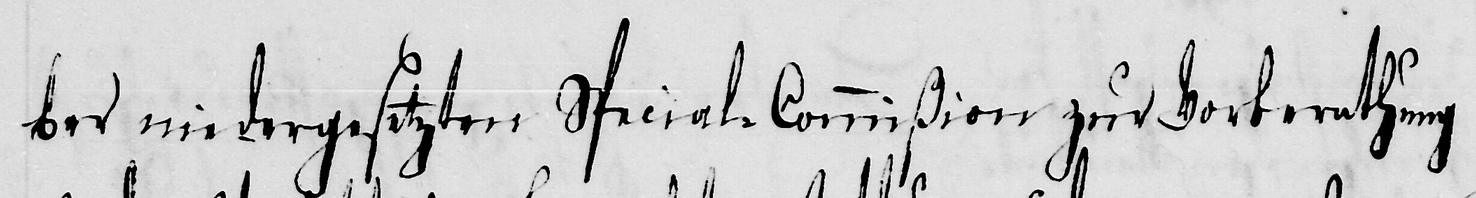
ber niedergesetzten Special-Commißion zur Vorberathung
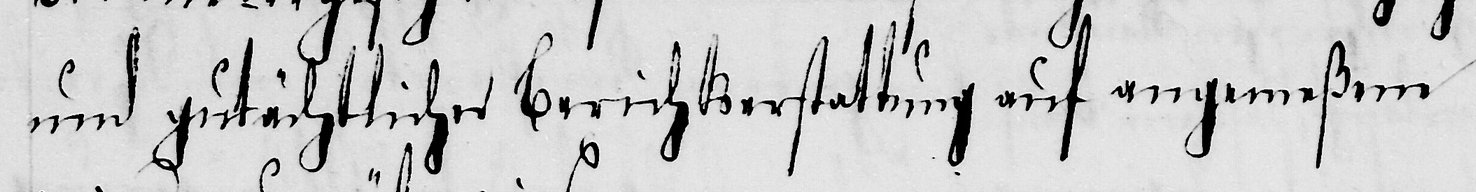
und gutächtlicher Berichtserstattung auf angemeßene
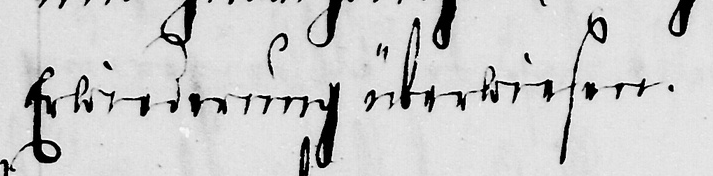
Erwiederung überwiesen.
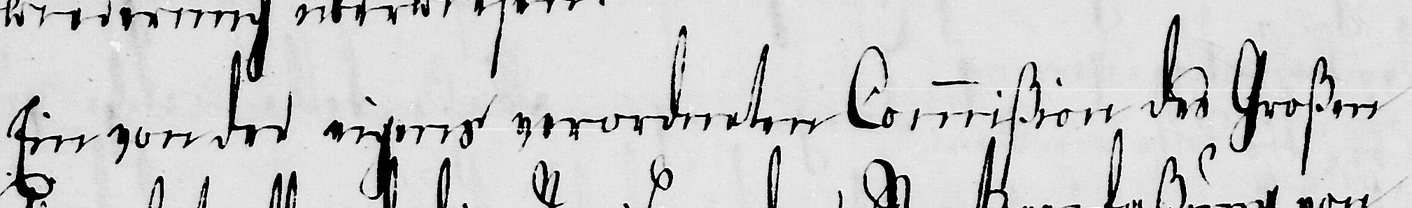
Ein von der eigens verordneten Commißion des Großen
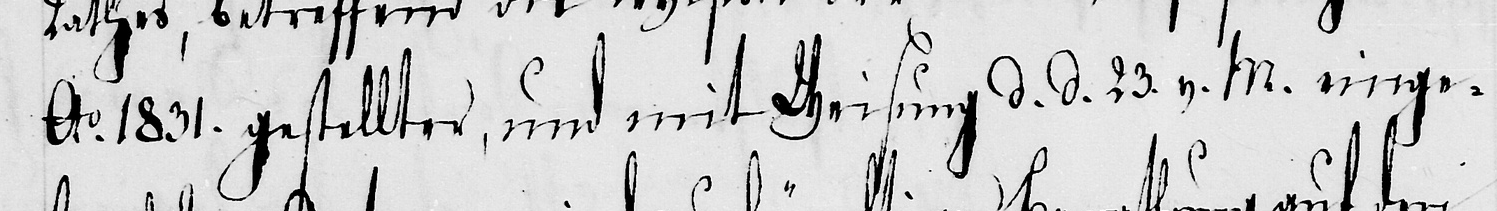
Ao. 1831. gestellter, und mit Weisung d. d. 23. v. M. einge¬
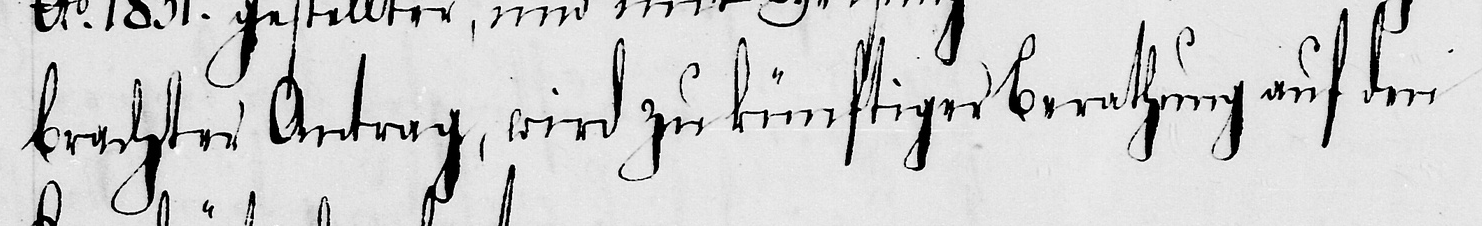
brachter Antrag, wird zu künftiger Berathung auf den
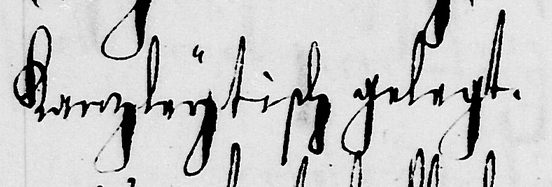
Kanzleytisch gelegt.
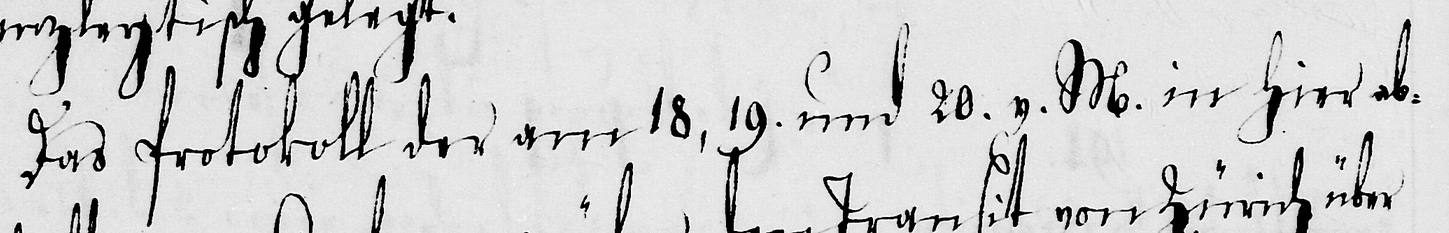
Das Protokoll der am 18, 19. und 20. v. M. in hier ab¬
